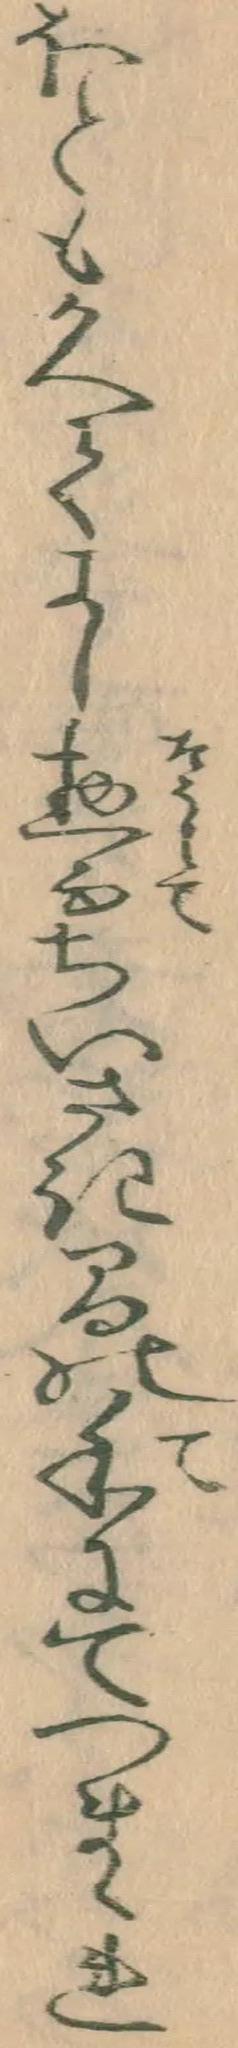ほともかへてよし惣而ちいさき間の手にてつまゝれ
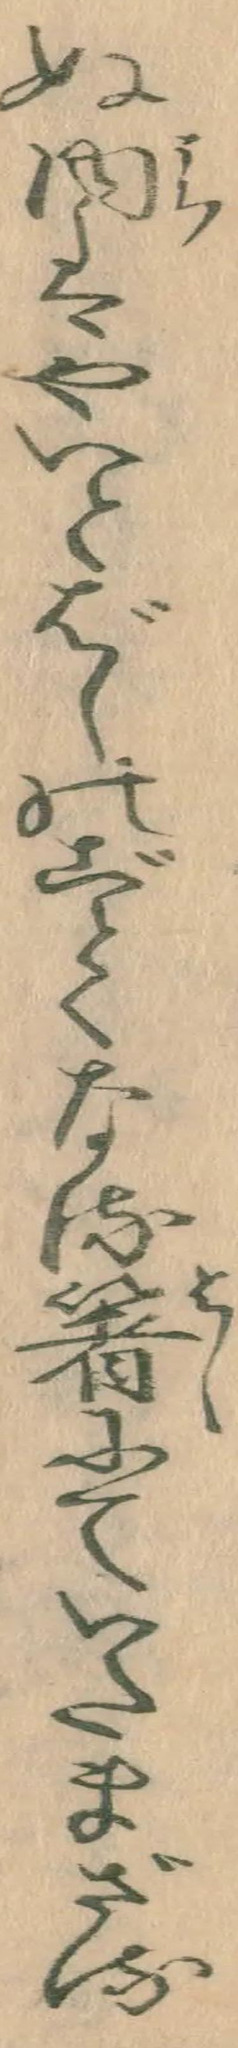ぬ内はやいとばしのごとくなる箸にていたまざる
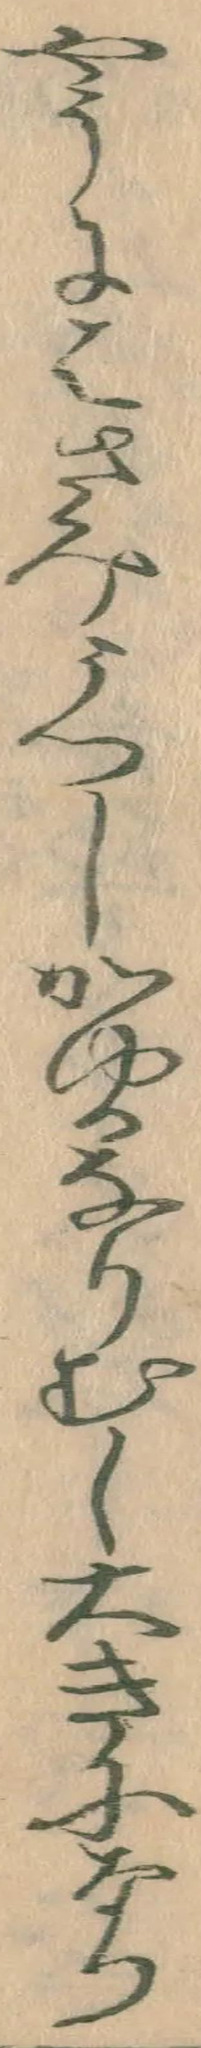やうにはさみうつしかゆるなりむし大きになり
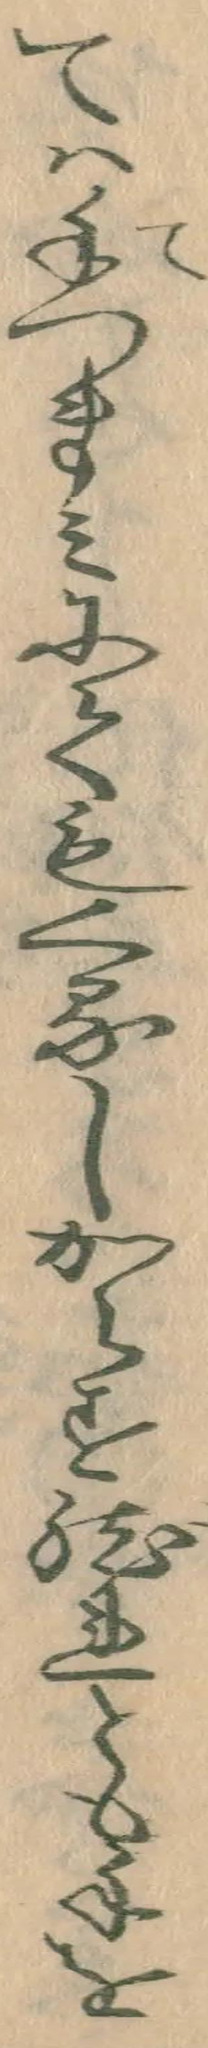ては手つまみにてもくるしからす然れとも手を
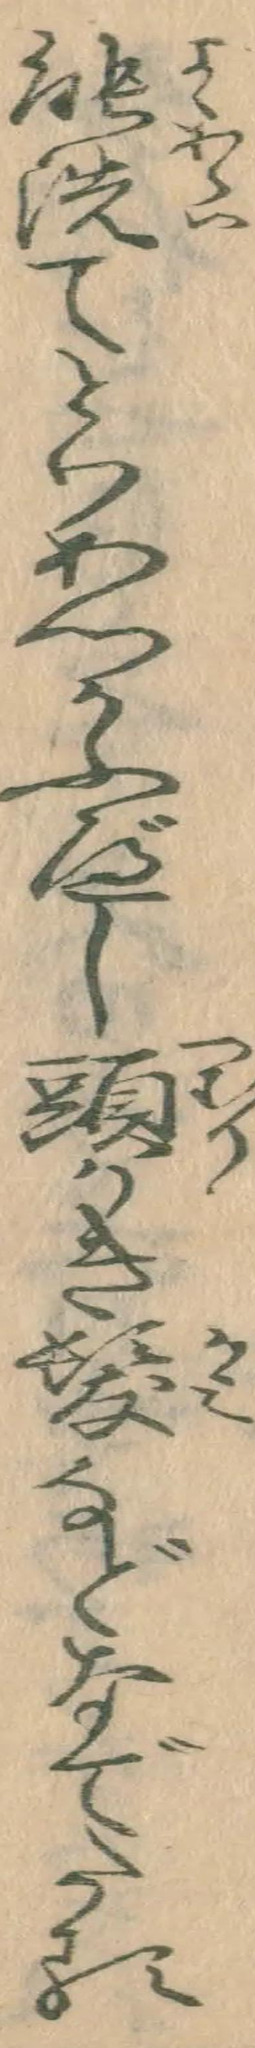能洗てとりあつかふべし頭かき髪などなでたる
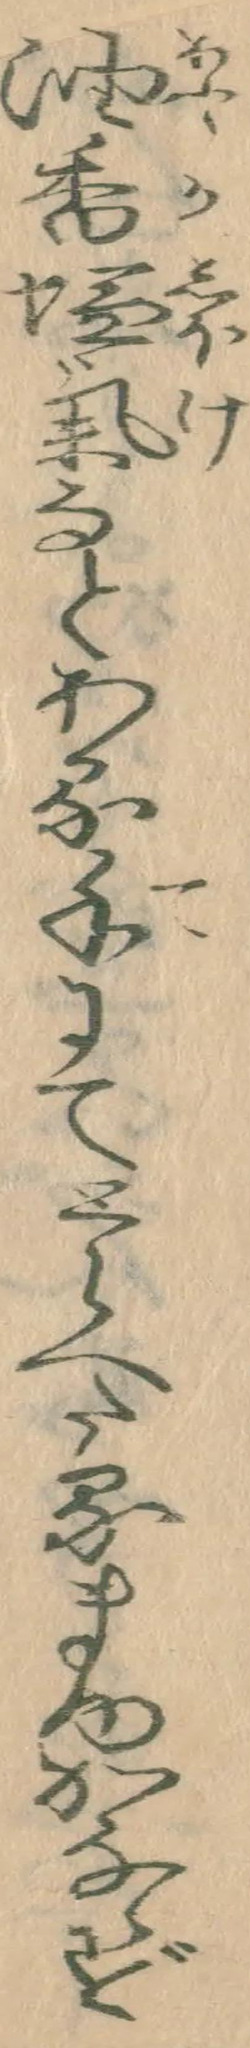油香塩気なとある手にてとらへたるまゆかならず
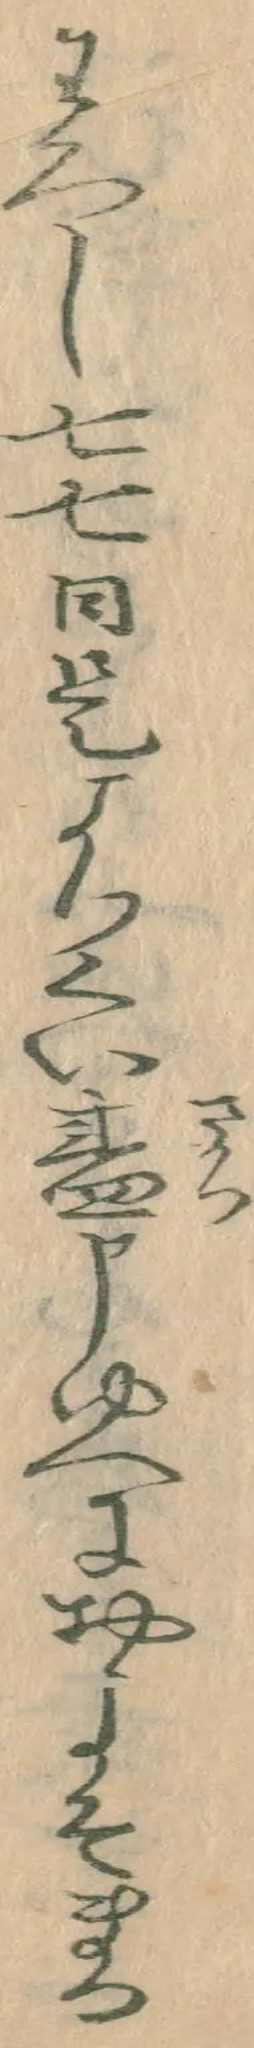わろし七七日是よりくい盛申ゆへにおよそまる
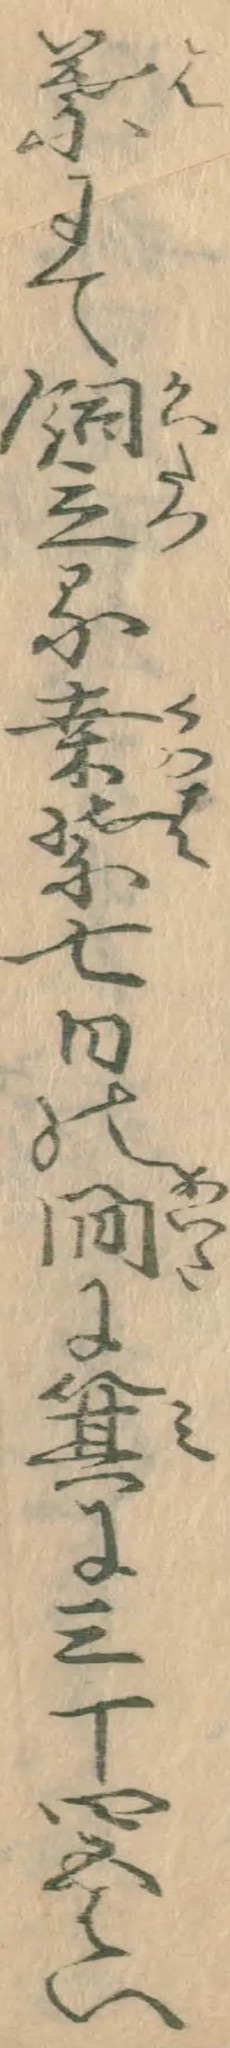葉にて飼立る桑葉七日の間に箕に三十四五はい
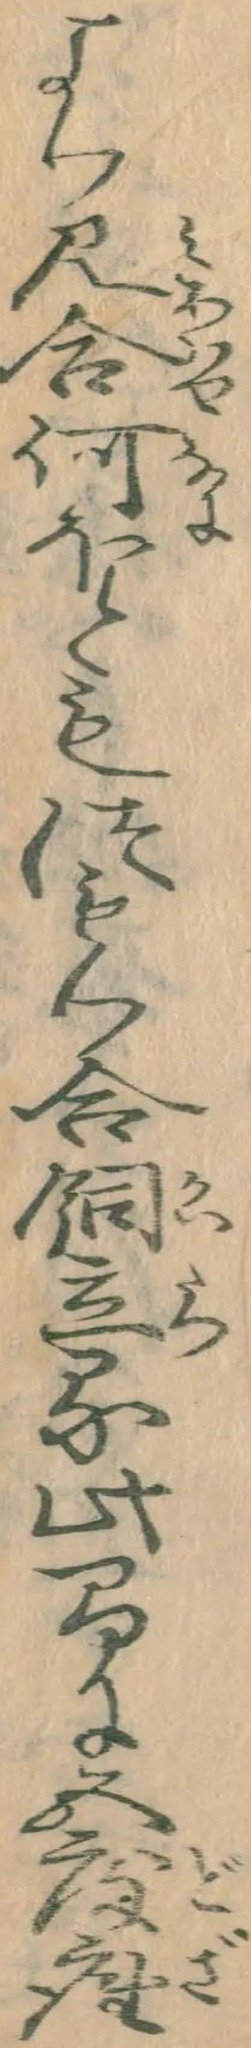より見合何ほともつもり合飼立る此間に五度座

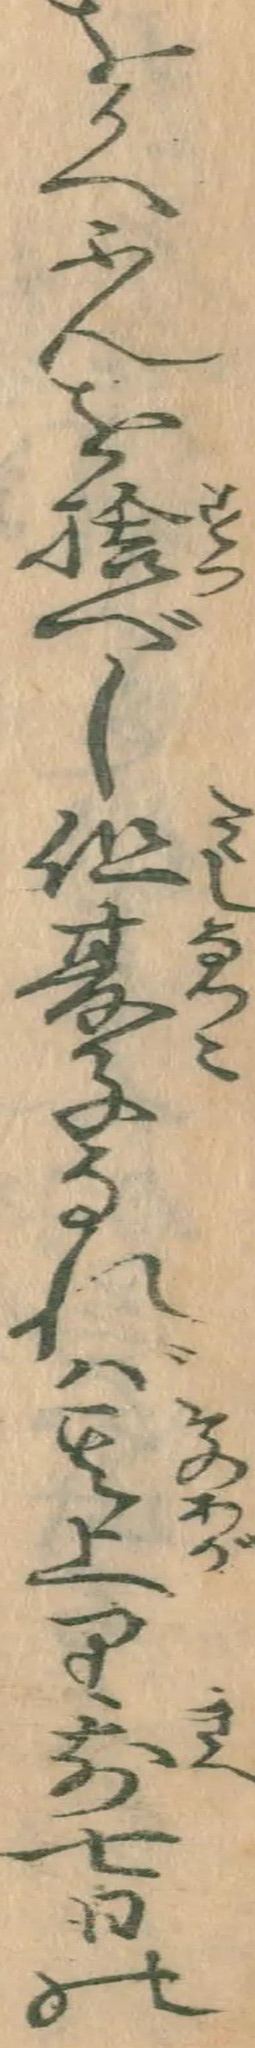をかへふんを捨べし但夏子なれば其上り前七日の
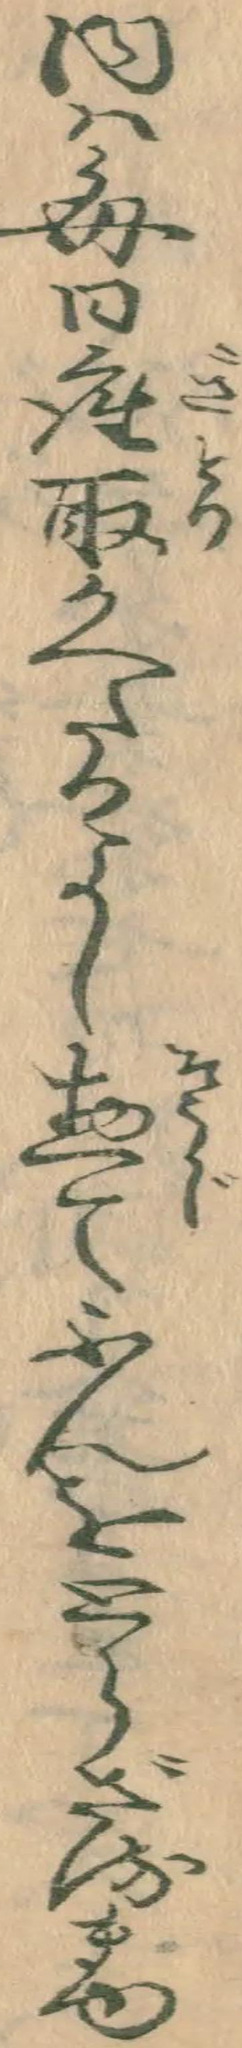内は毎日座取かへたるよし惣てふんをとらざるまゆ
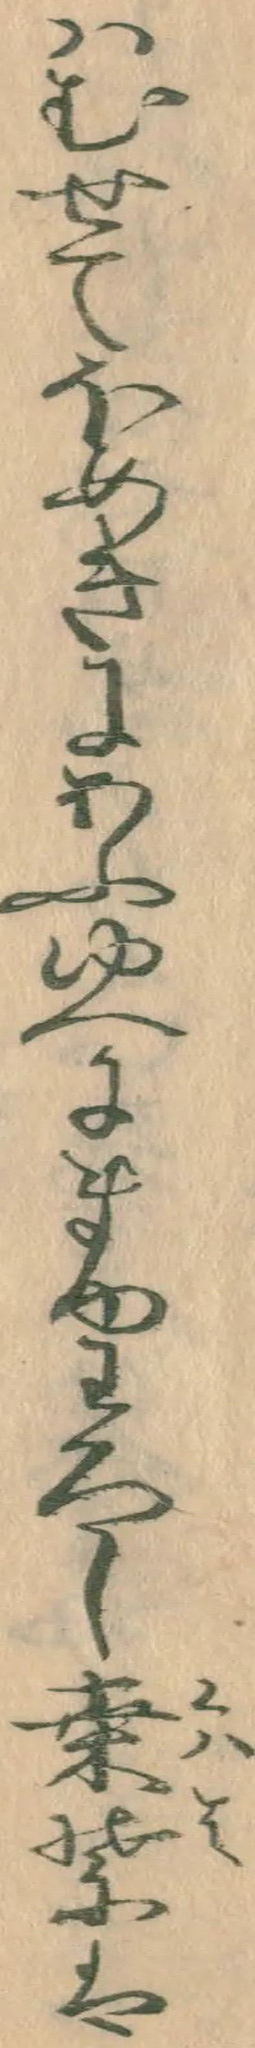はむせてほめきにあふゆへにまゆわろし桑葉は
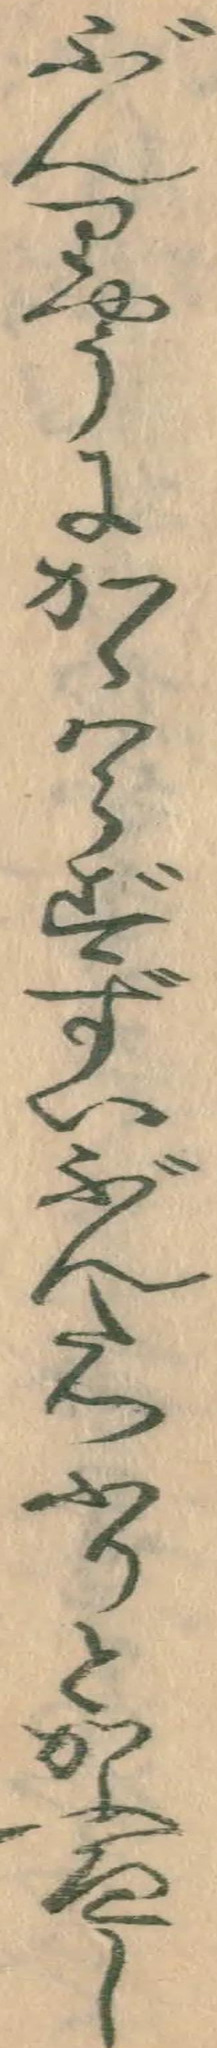ぶんりやうにかゝはらずいぶんたつふりとかふへし
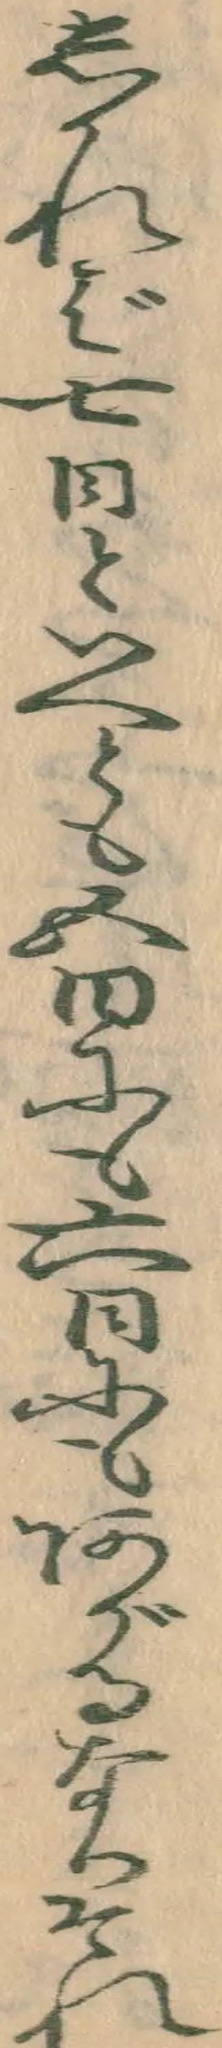しかれば七日といへとも五日にも六日にもあがるなりそれ
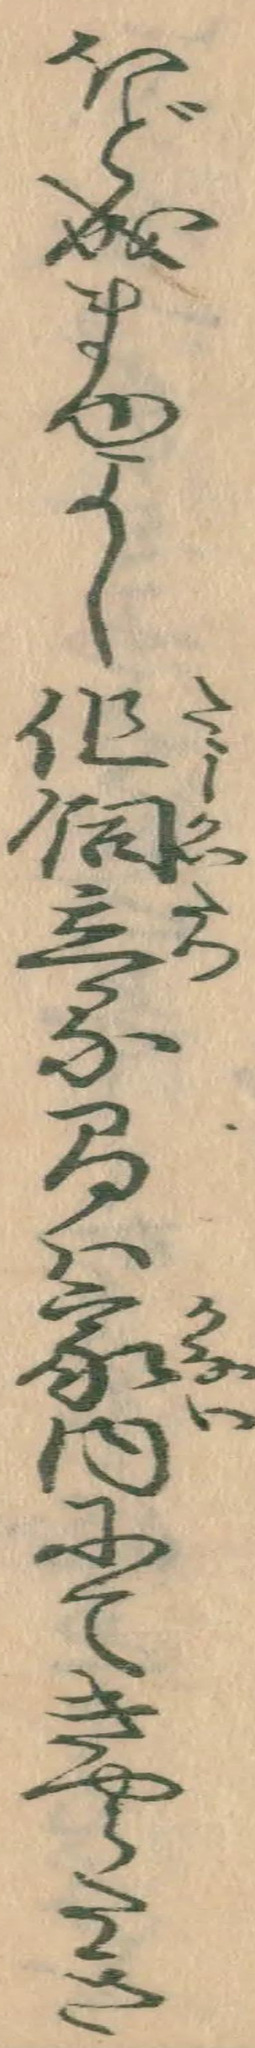ほど成まゆよし但飼立る間は家内にてきやらたき
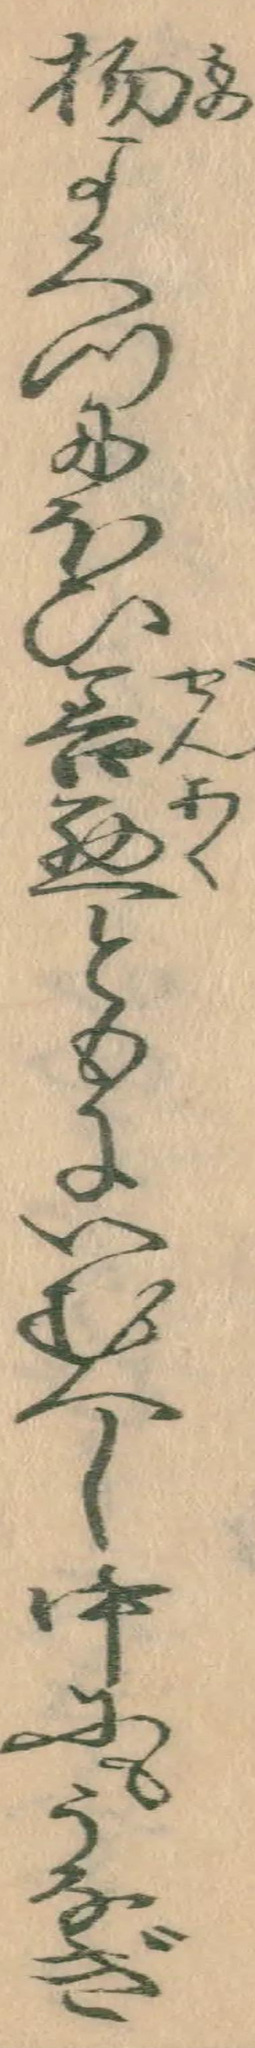物よろつにほひ善悪ともにいむへし中にもうなぎ
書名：蚕飼養法記
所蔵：国立国会図書館 National Diet Library, JAPAN
